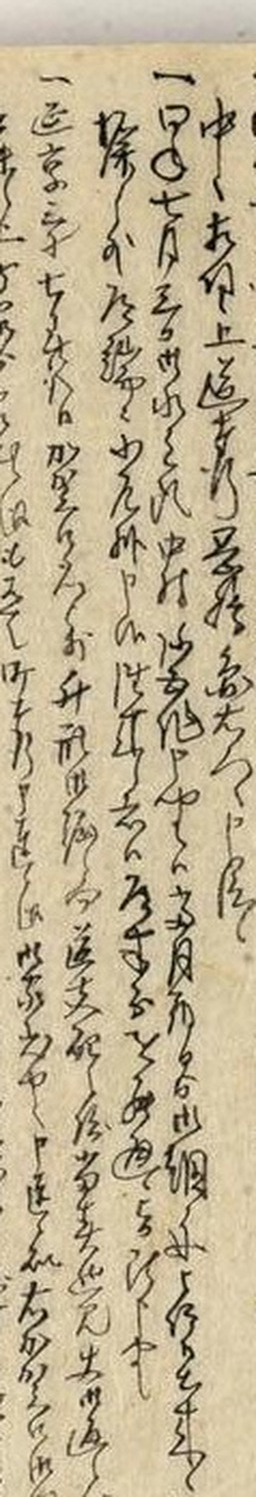塀之外道端に小屋掛申候往来之者は道半分を罷通候旨断申聞候
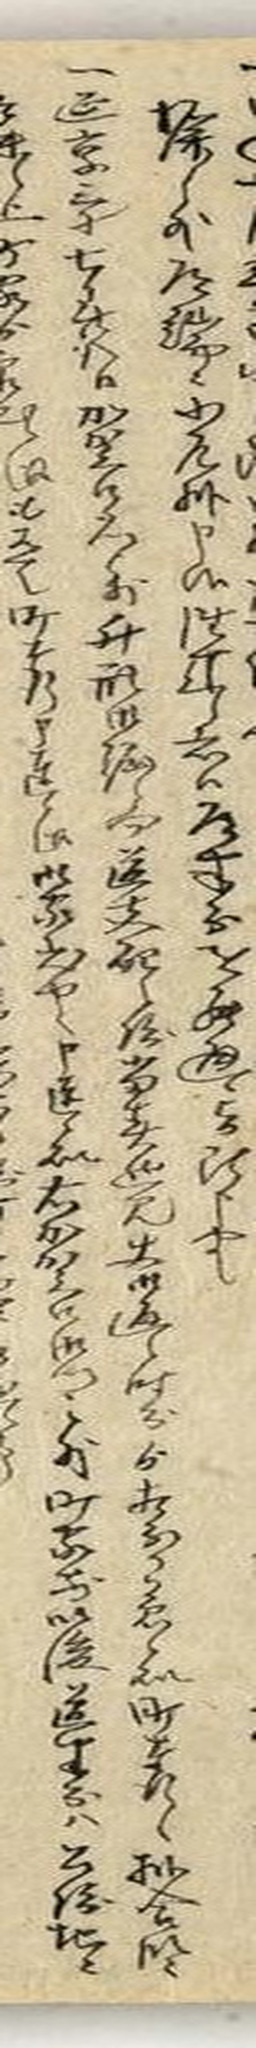吟味之上町家ゟ願出候趣も有之町奉行申達候趣御家老中へ申達候処右加賀口御門之外町家前以後道半分は公儀地に
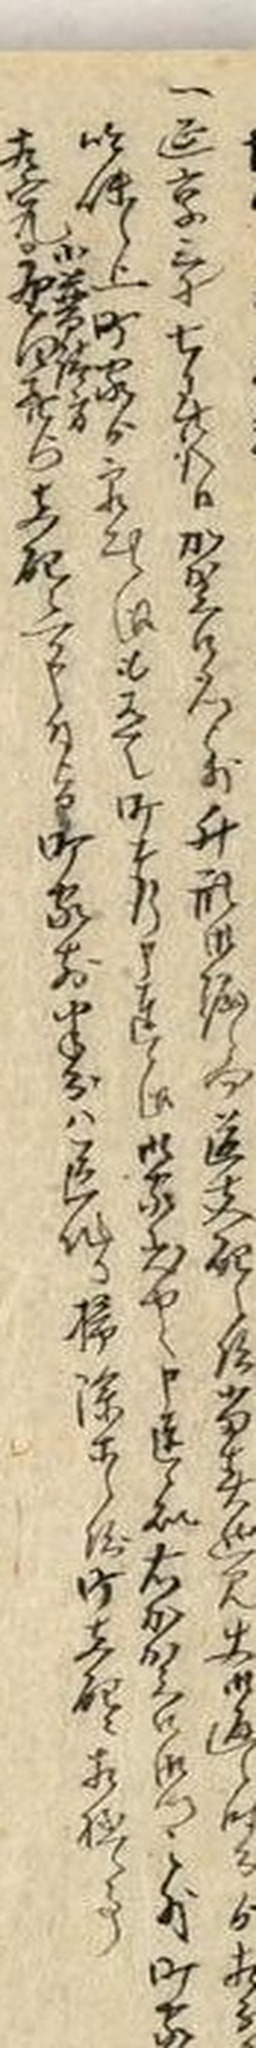相究◦小普請方野田喜右衛門支配に可申付旨町家前半分は道作り掃除等之儀町支配に相極候事

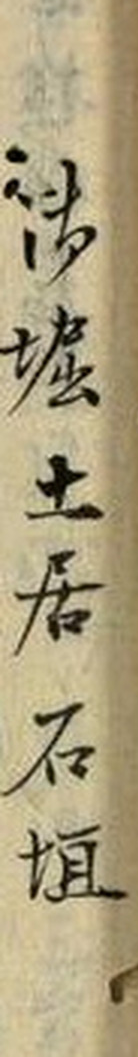御堀土居石垣
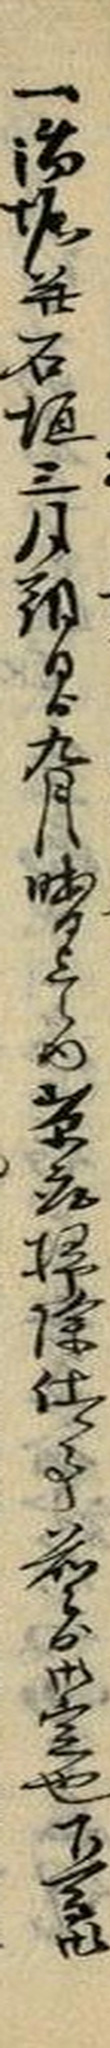一御堀并石垣三月朔日ゟ九月晦日迄之内草取掃除仕候事前々ゟ御定也下馬御
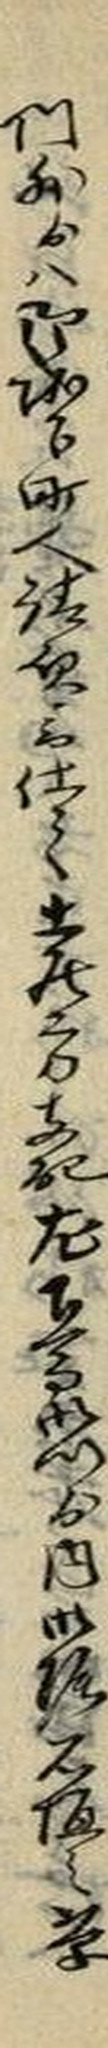門外ゟハ御城下町人請負ニ而仕之土居方支配尤下馬御門ゟ内御堀石垣之草
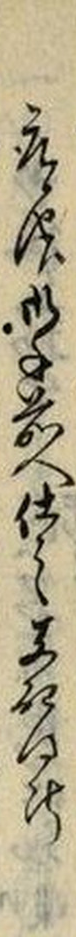取之儀ハ御手前人仕之支配同断
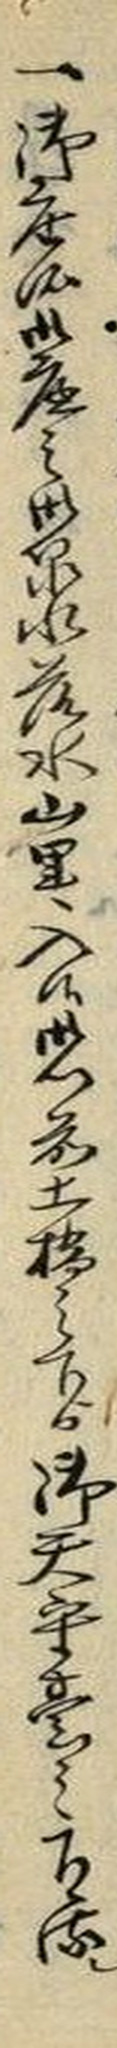一御座所御庭之御泉水落水山里へ入候御門前土橋之下ゟ御天守台之下へ流レ
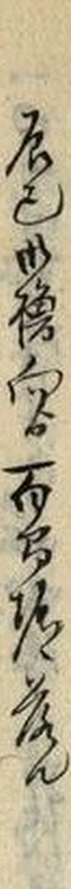辰巳御櫓向ゟ百間堀へ落ル
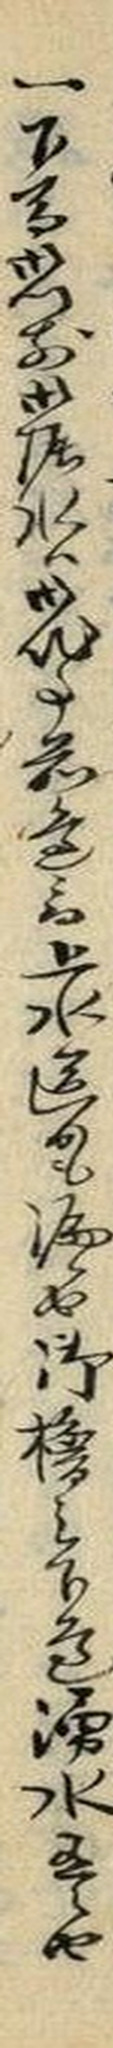一下馬御門前御堀水は御作事前辺にて上水道ゟも漏候由御櫓之下辺湧水有之由
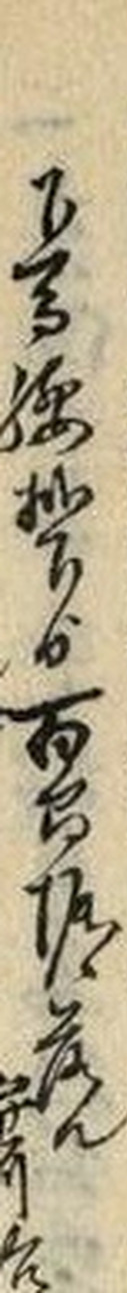下馬腰掛下ゟ百間堀へ落ル
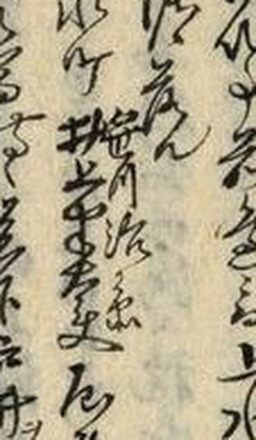笹川治兵衛
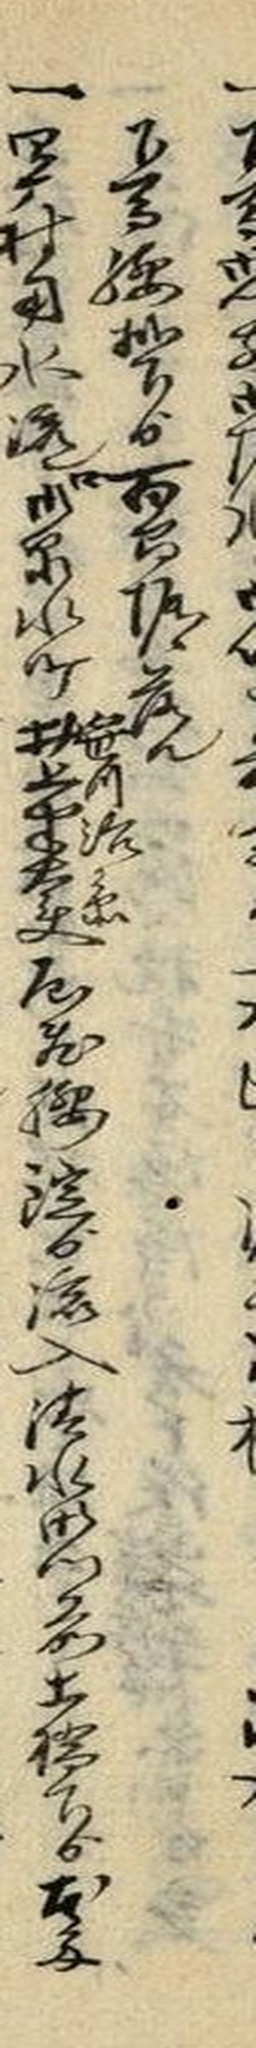一四ケ村用水流レ口御泉水町井上半太夫屋敷腰錠ゟ流入清水御門前土橋下ゟ本多
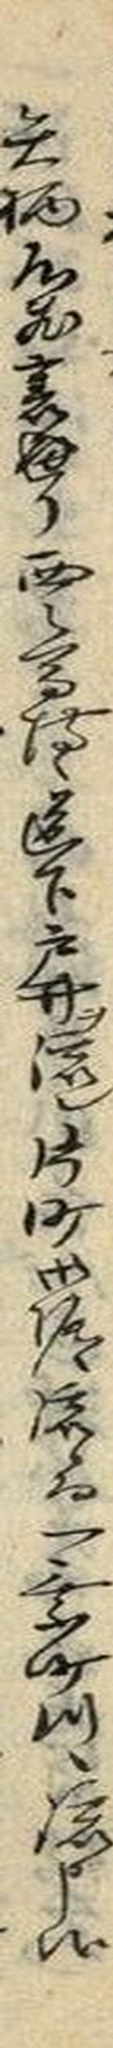矢柄屋敷裏通り西之馬場へ道下戸井ヲ流レ片町御堀へ流候て一乗町川へ流申候
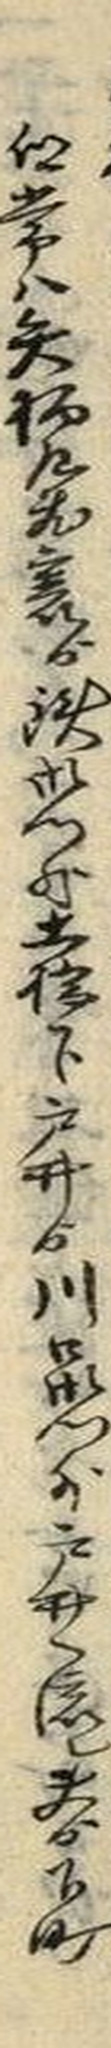但常は矢柄屋敷裏ゟ鉄御門外土橋下戸井ゟ川口御門外戸井へ流レ夫ゟ下町
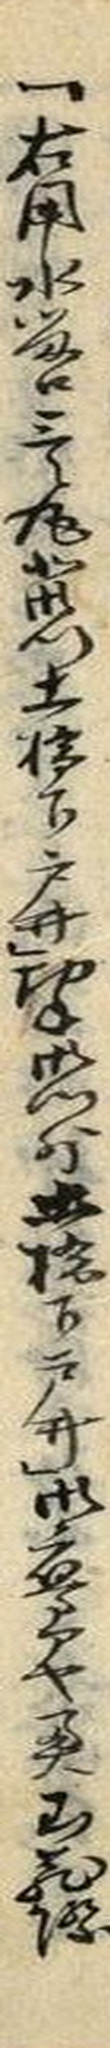一右用水留口三之丸北御門土橋下戸井」切手御門外土橋下戸井」御鷹部ヤ奥玉蔵際
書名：御城下諸事之部
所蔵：福井県文書館 Fukui Prefectural Archives
